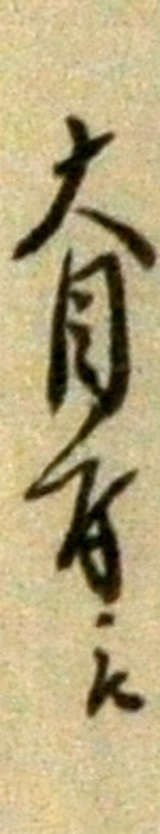大目付え
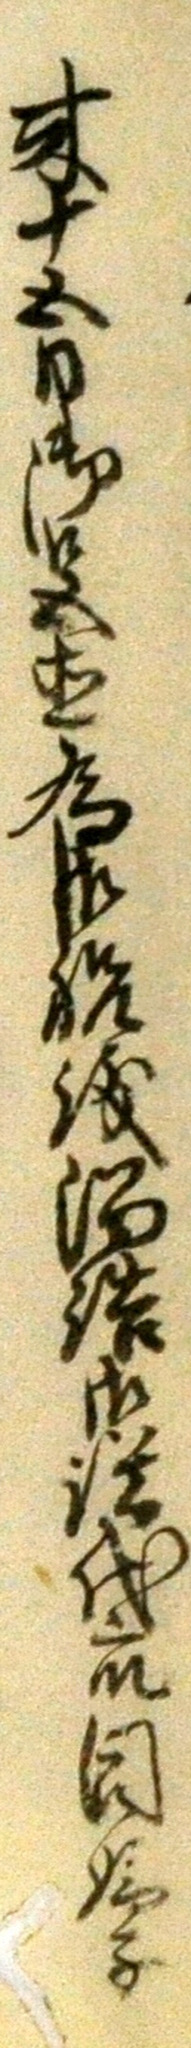来十五日御色直為御祝儀溜詰御譜代衆同嫡子
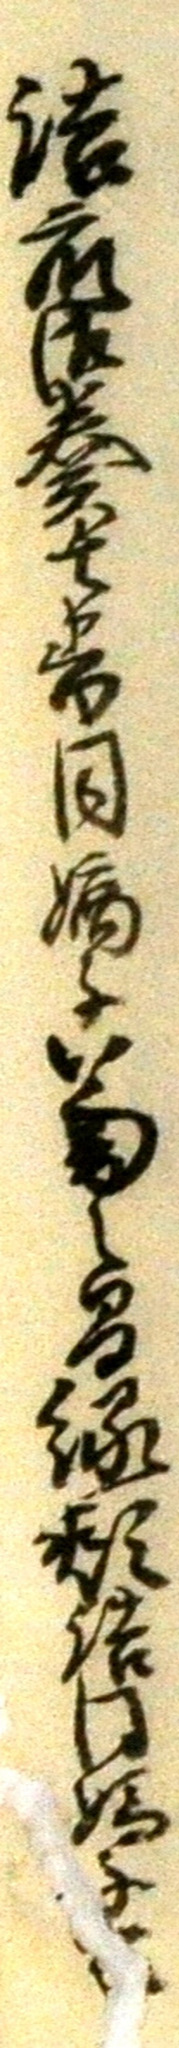詰衆御奏者番同嫡子菊之間縁頬詰同嫡子登

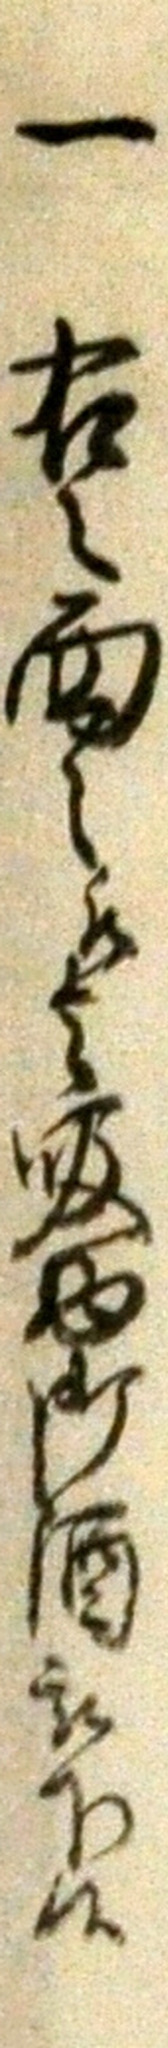一右之面々えは吸物御酒被下候
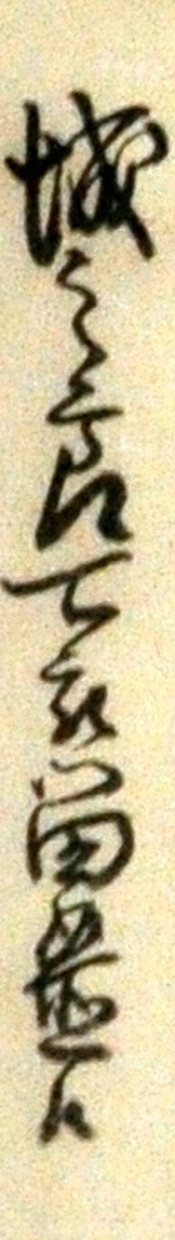城之節可被留置候
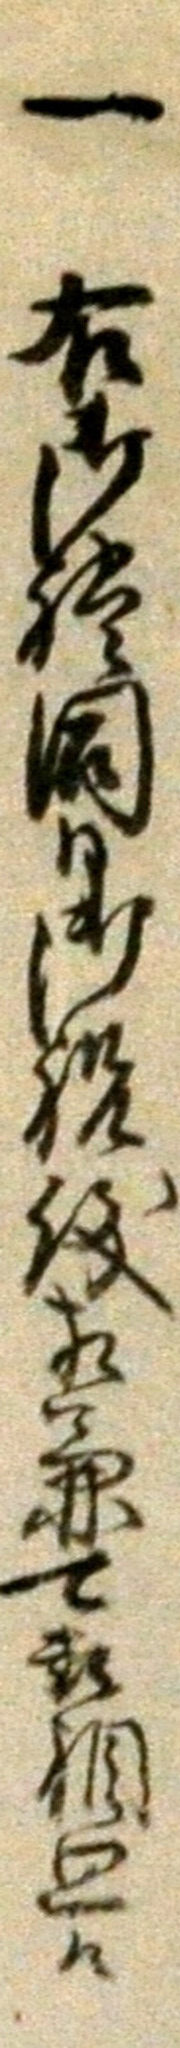一右御礼同日御祝儀相兼可被相廻候
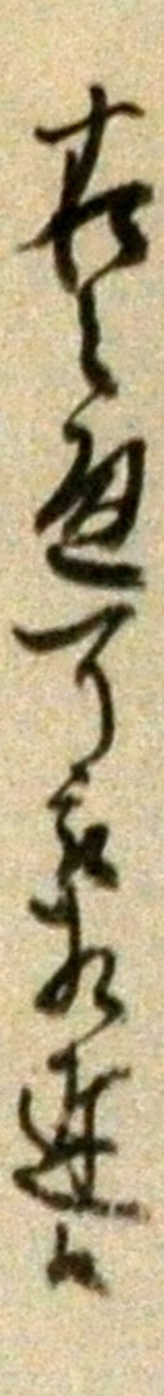右之通可被相達候
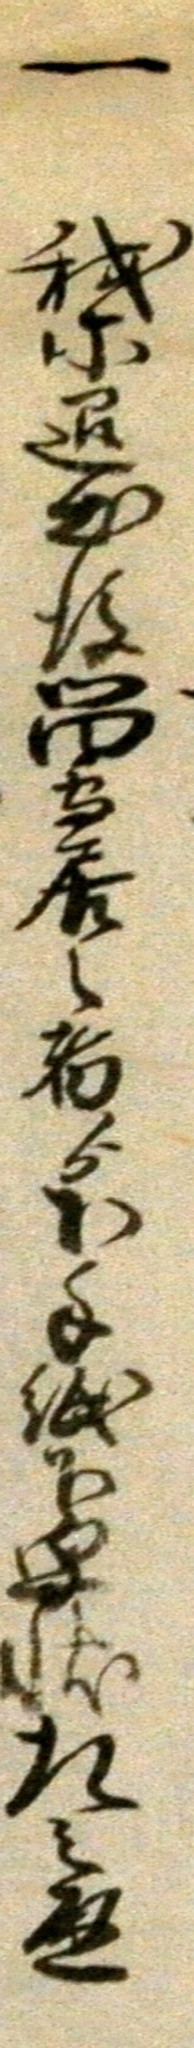我等退出後留守居之者ゟ下手紙下廻状左之通
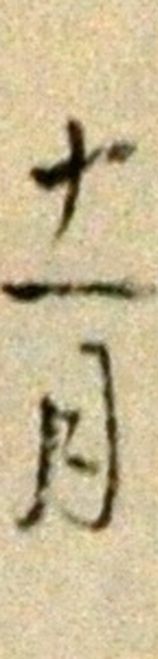十一月
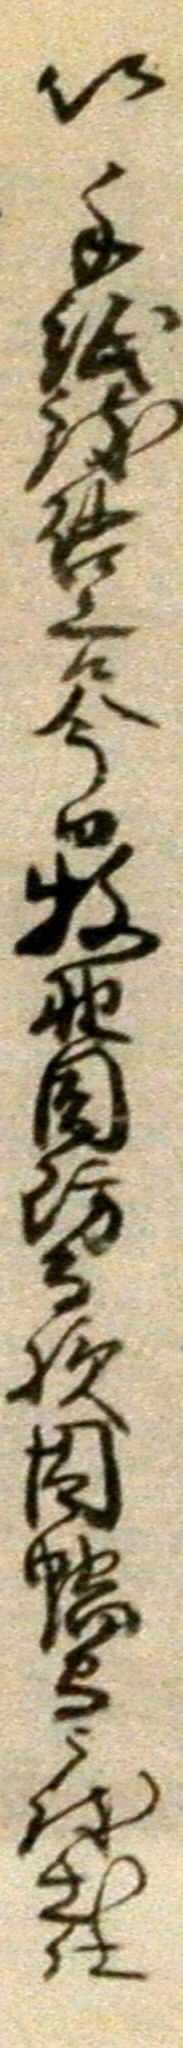以手紙致啓上候今日牧野周防守様因幡守被致出仕
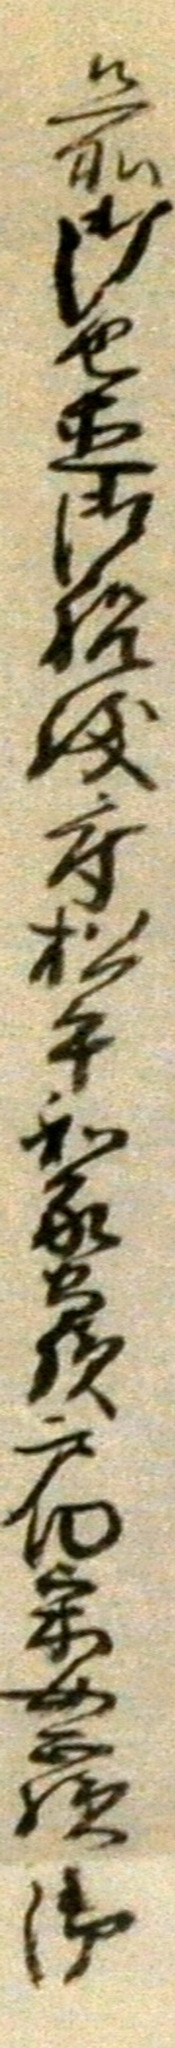候所御色直御祝儀ニ付松平和泉守様戸田采女正様御
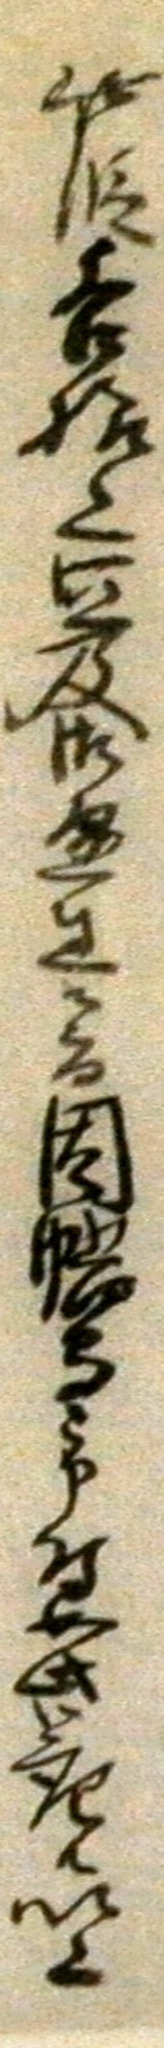此段各様上宜及御通達候旨因幡守被申付如此御座候以上
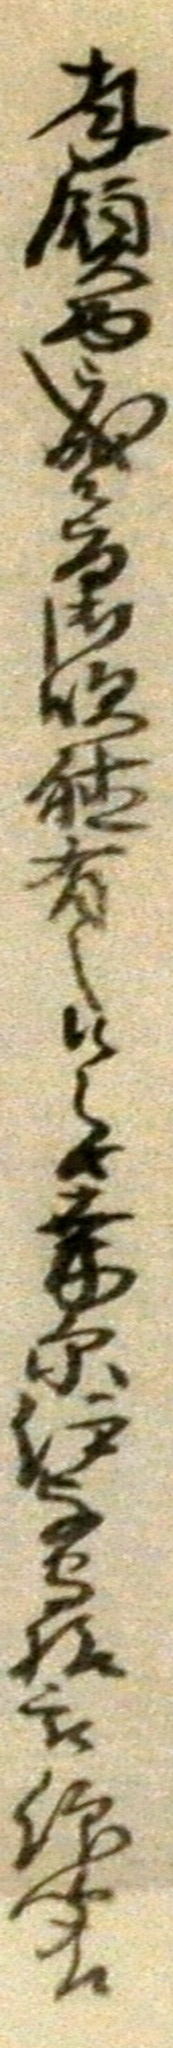拝領物被成候旨御吹聴有之候之由桑原伊与守様被仰聞候
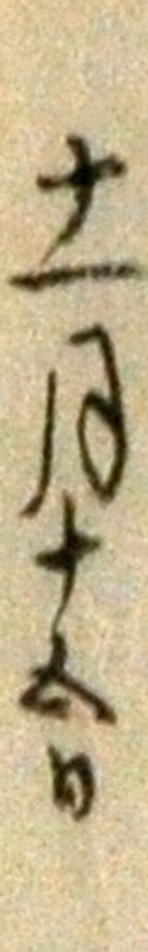十一月十五日
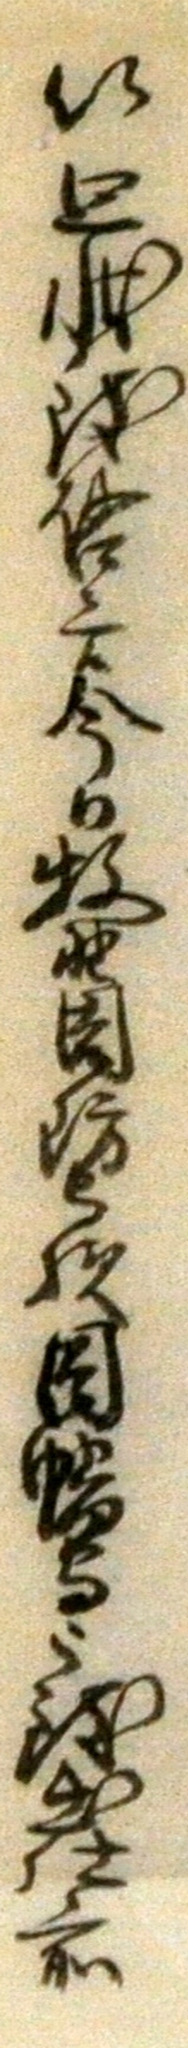以廻状致啓上候今日牧野周防守様因幡守被致出仕候所
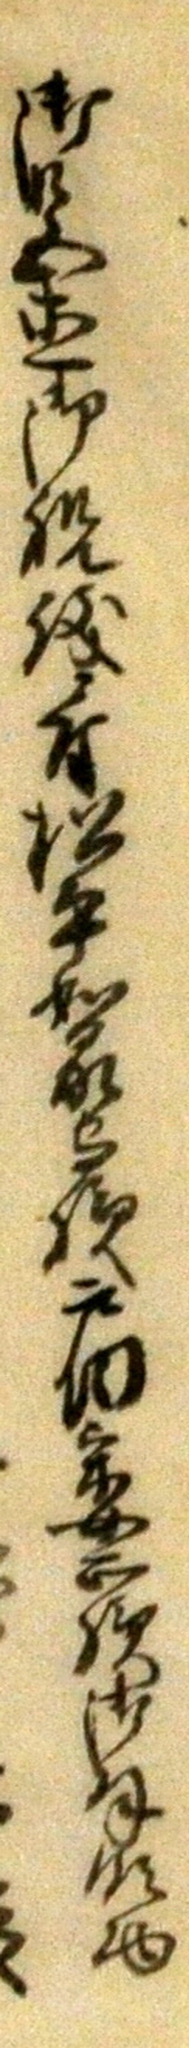御色直御祝儀ニ付松平和泉守様戸田采女正様御拝領物
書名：若君様御色直御祝儀ノ節ノ留
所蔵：伊那市立高遠町図書館・合同会社AMANE
